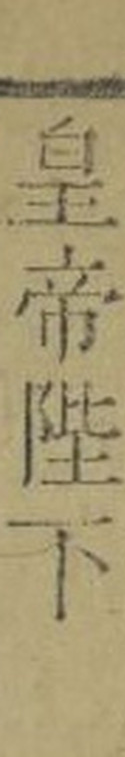皇帝陛下
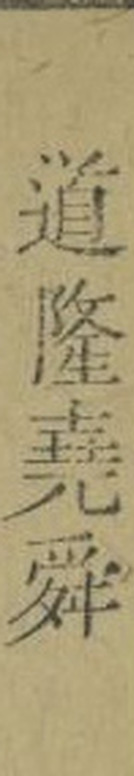道隆堯舜
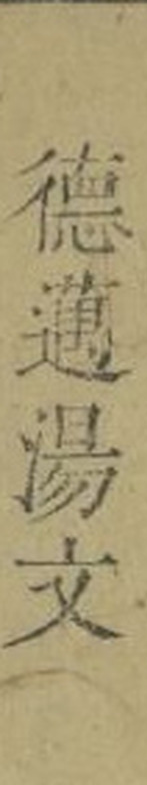德邁湯文
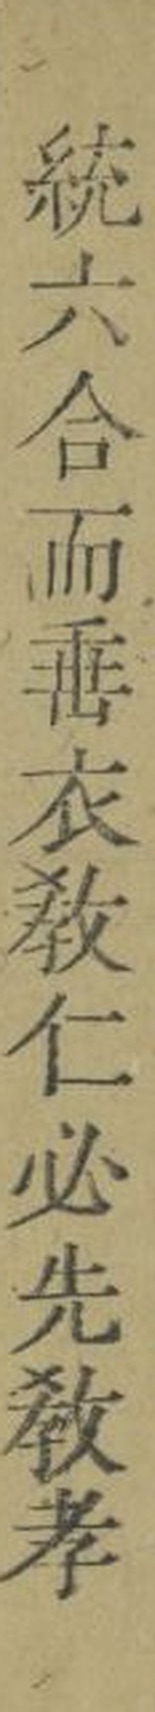統六合而垂衣敎仁必先敎孝
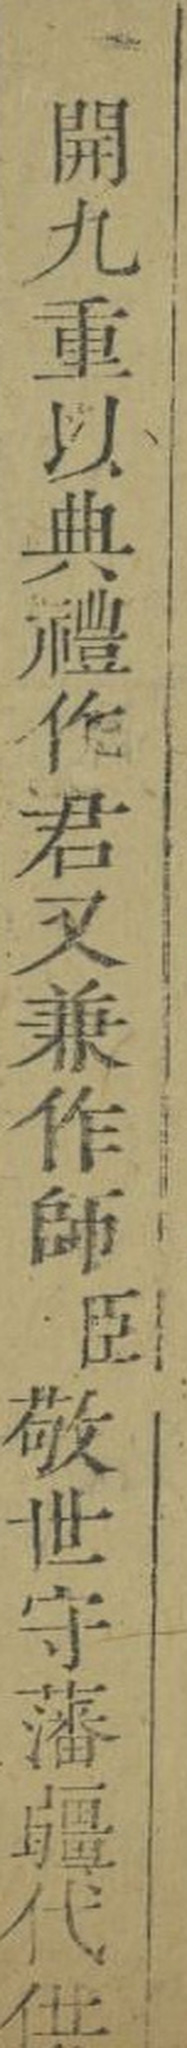開九重以典禮作君又兼作師臣敬世守藩疆代供
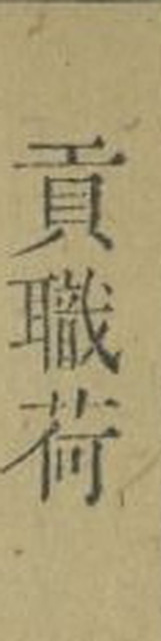貢職荷
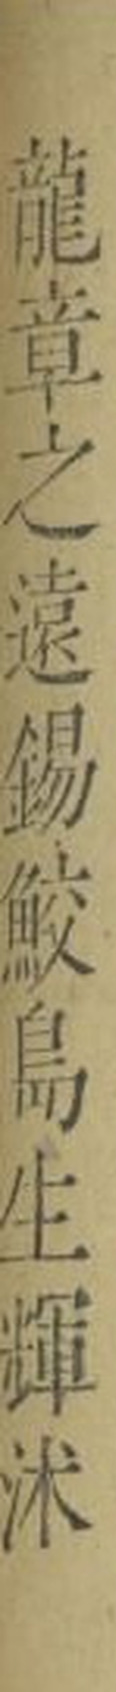龍章之遠錫鮫島生輝洣
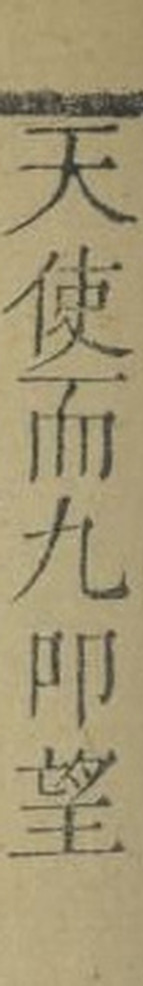天使而九叩望
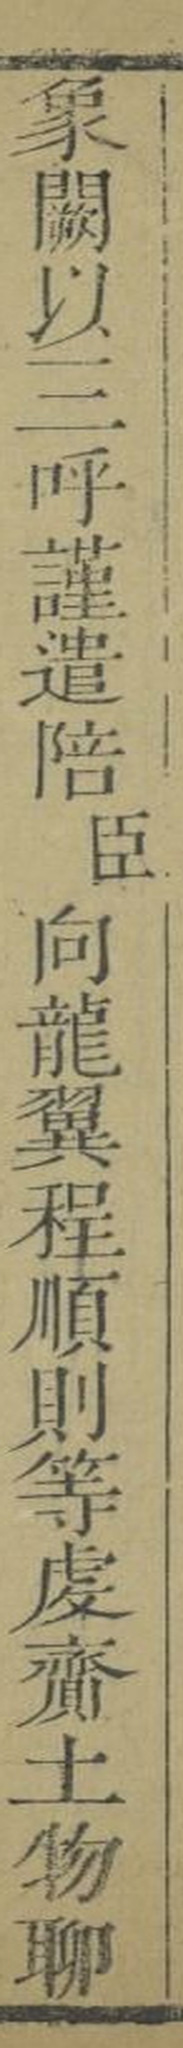象闕以三呼謹遣陪臣向龍翼程順則等虔齎土物聊
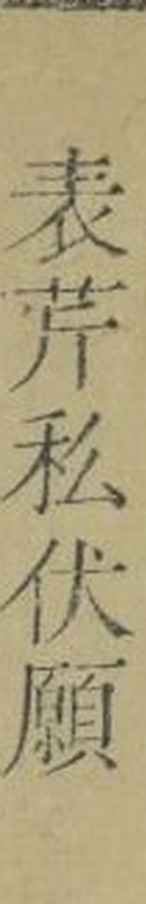表芹私伏願
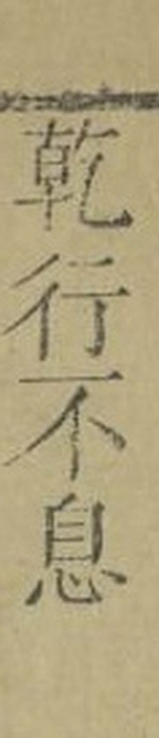乾行不息
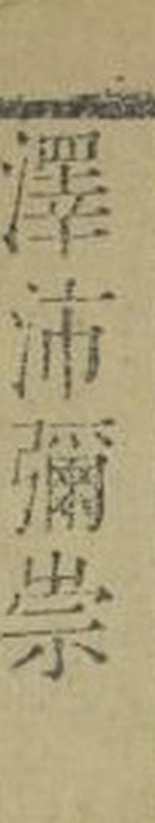澤沛彌崇
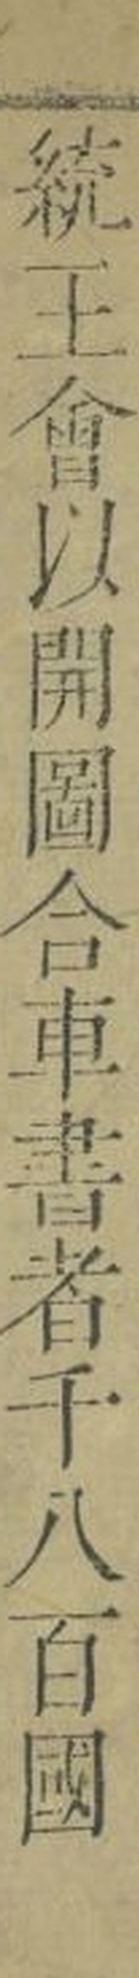統王會以開圖合車書者千八百國
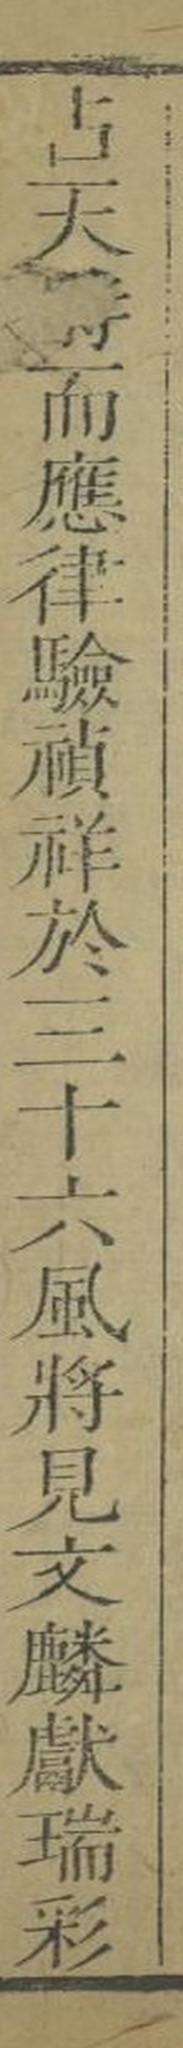占天時而應律驗禎祥於三十六風將見文麟獻瑞彩

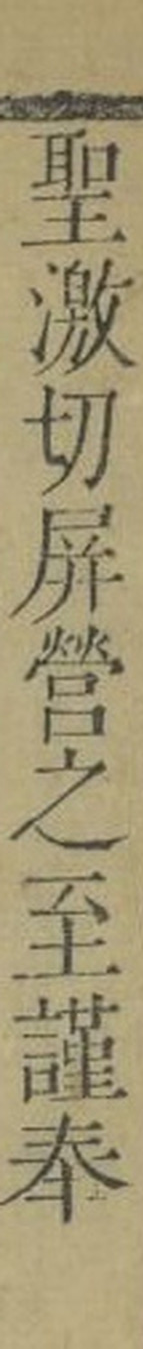聖激切屏營之至謹奉
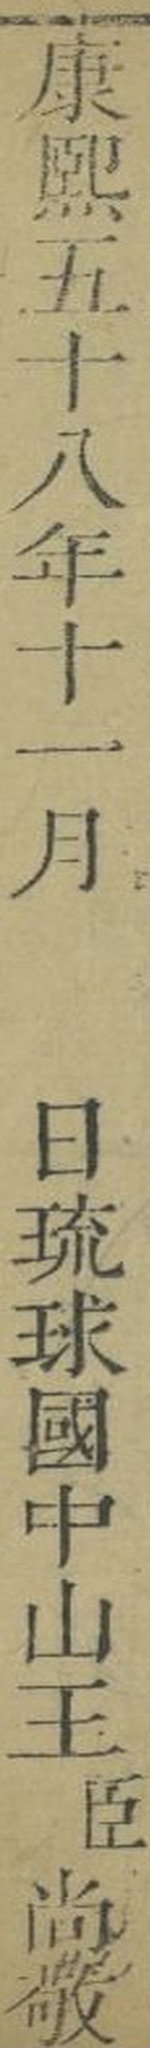康煕五十八年十一月日琉球國中山王臣尚敬
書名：中山伝信録 巻二
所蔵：University of the Ryukyus Library
